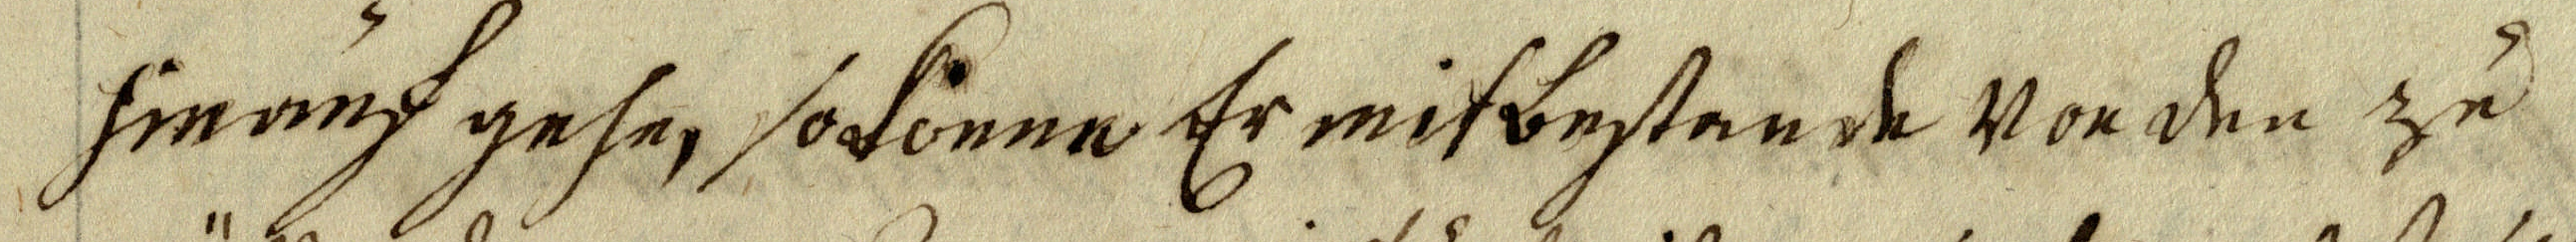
hierauf gehe, so könne Er mit Bestande von den zu
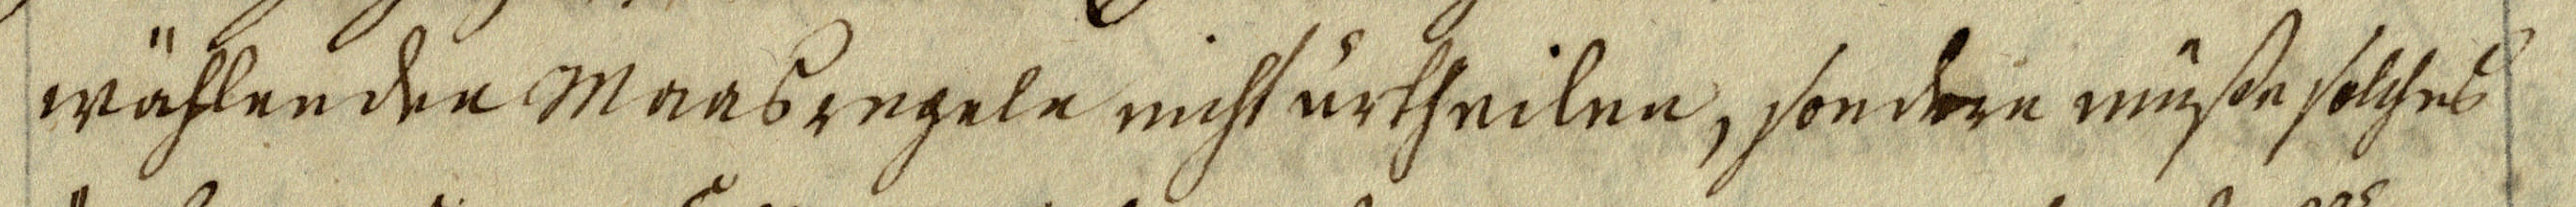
wählenden Maasregeln nicht urtheilen, sondern müße solches
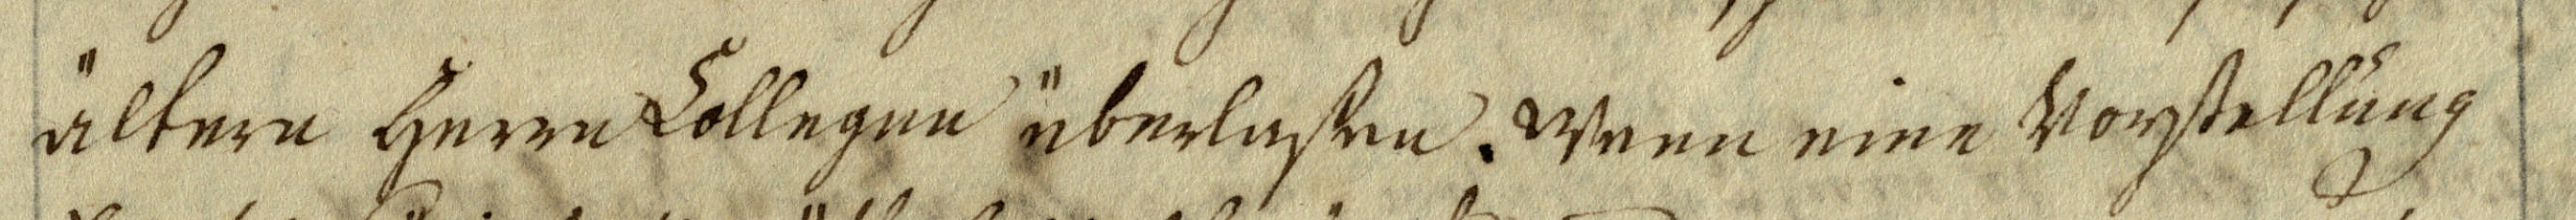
ältern Herrn Collegen überlaßen. Wenn eine Vorstellung
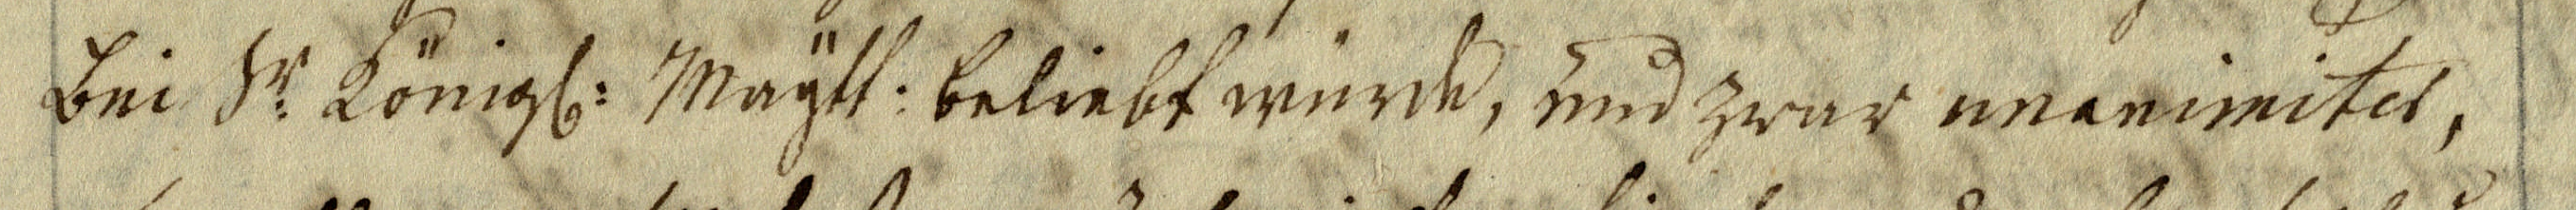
bei Sr. Königl. Maÿtt. beliebt würde, und zwar unanimiter,
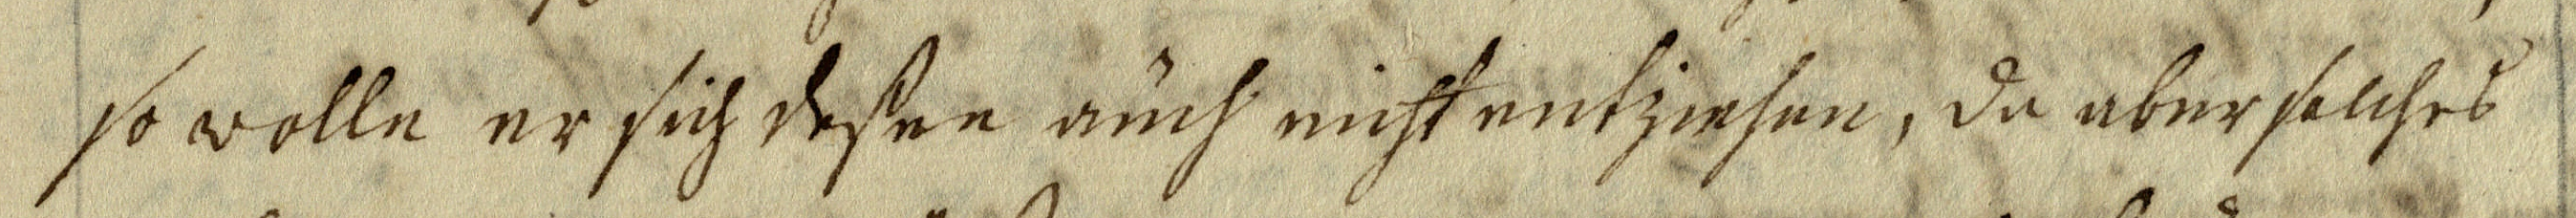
so wolle er sich deßen auch nicht enziehen, da aber solches
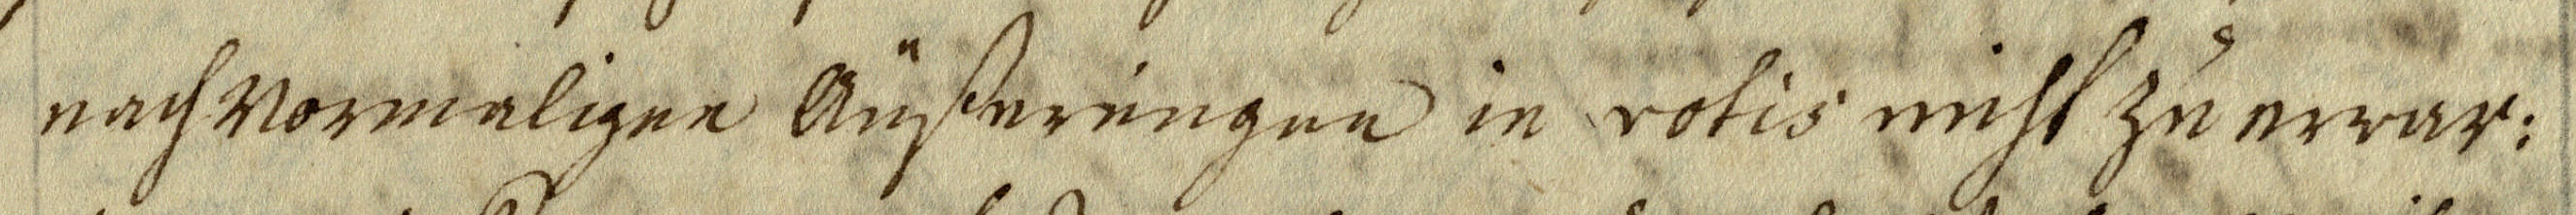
nach vormaligen Äußerungen in votis nicht zu erwar¬
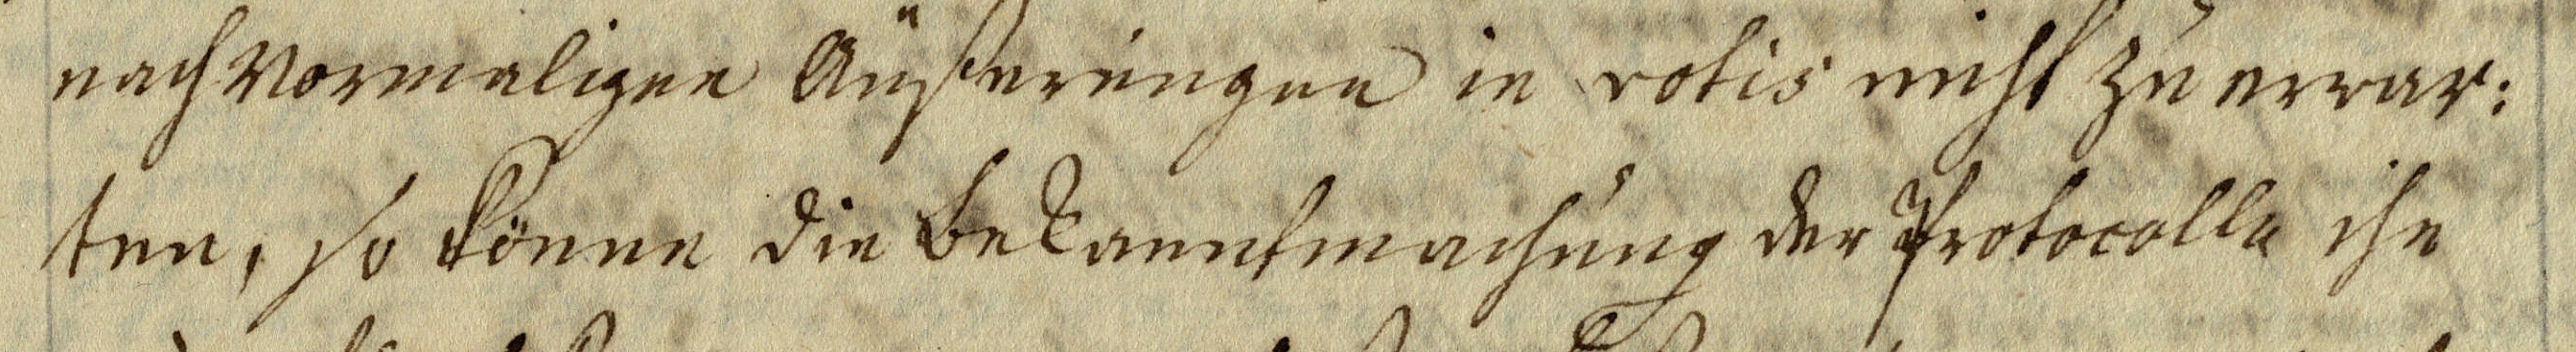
ten, so könne die Bekanntmachung der Protocolle ihn
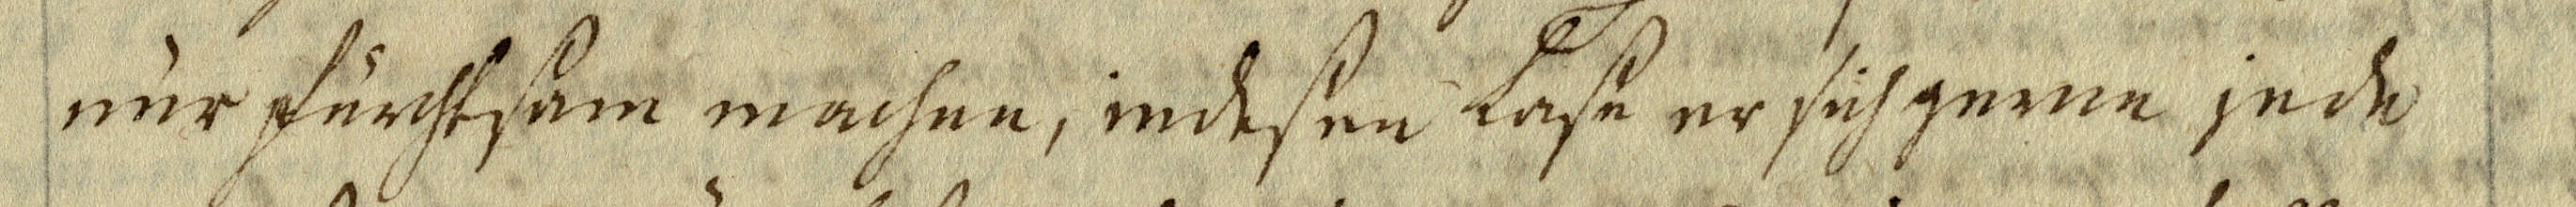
nur furchtsam machen, indeßen laße er sich gerne jede
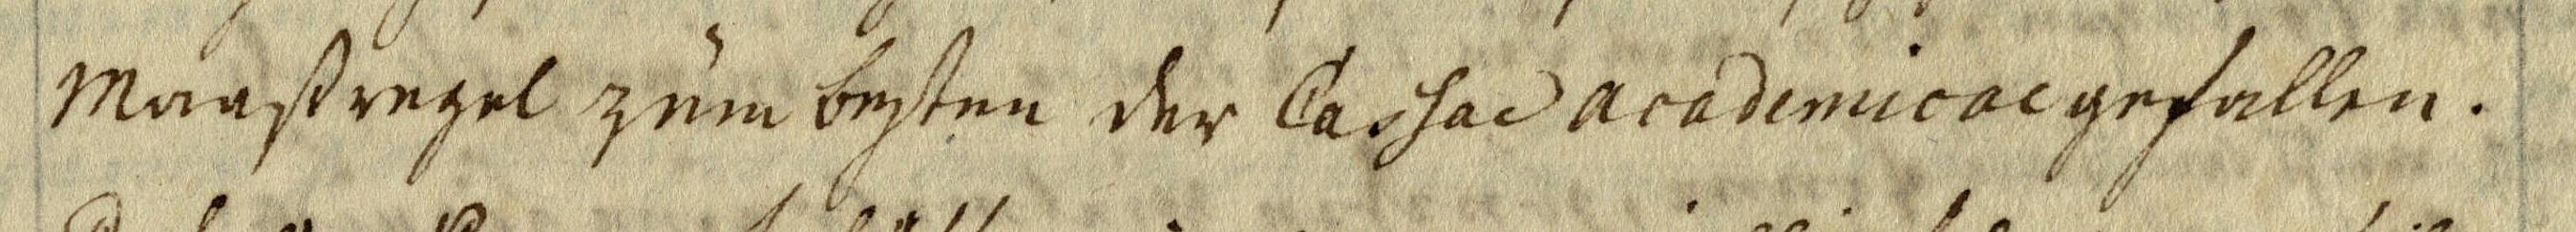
Maasregel zum besten der Cassae Academicae gefallen.
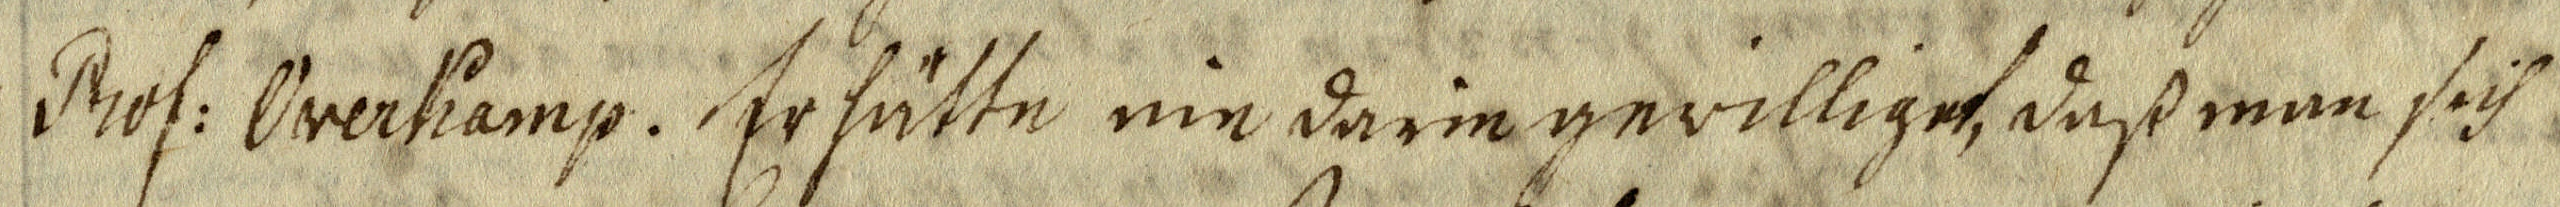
dh Prof. Overkamp. Er hätte nie darin gewilliget, daß man sich
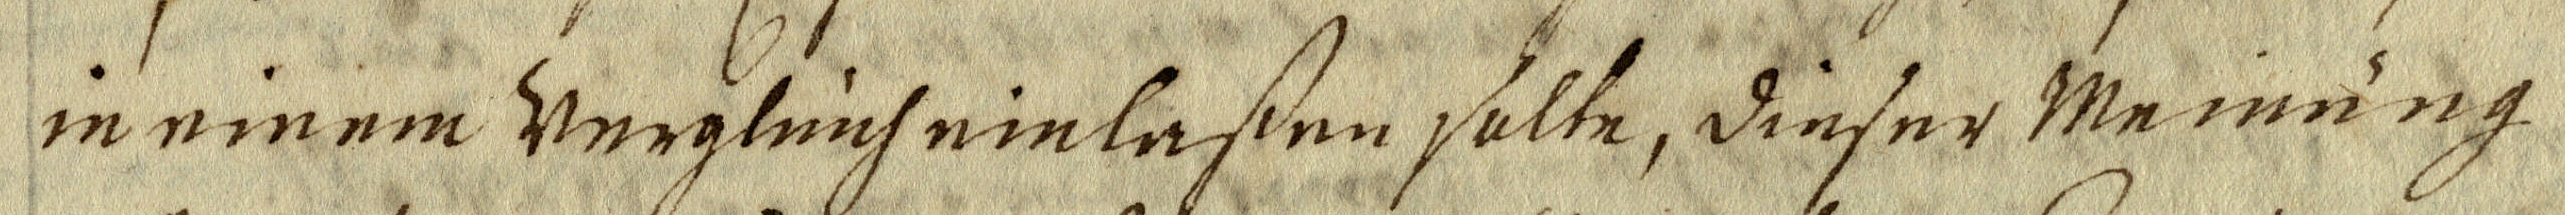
in einem Vergleich einlaßen solte, dieser Meinung
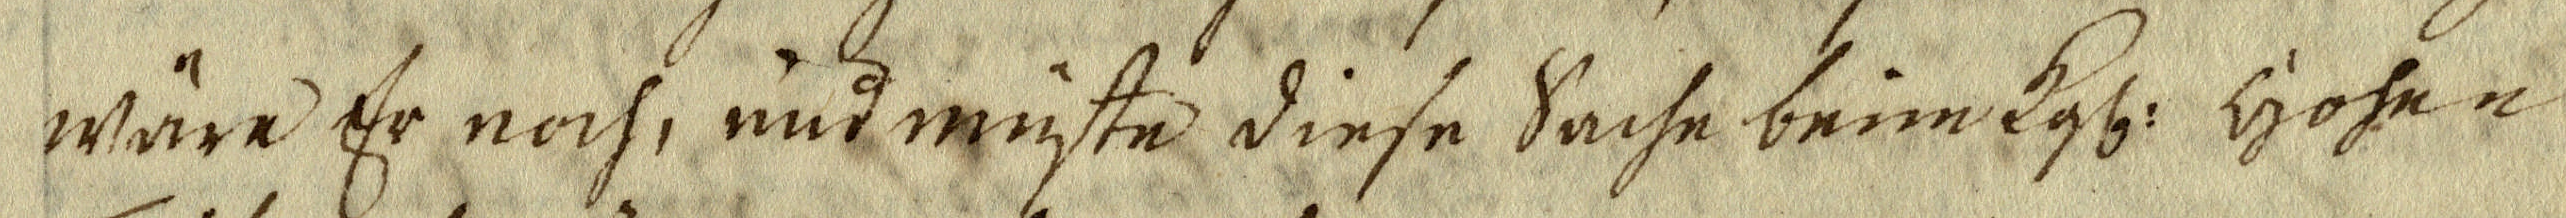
wäre Er noch, und müste diese Sache beim Kgl. Hohen
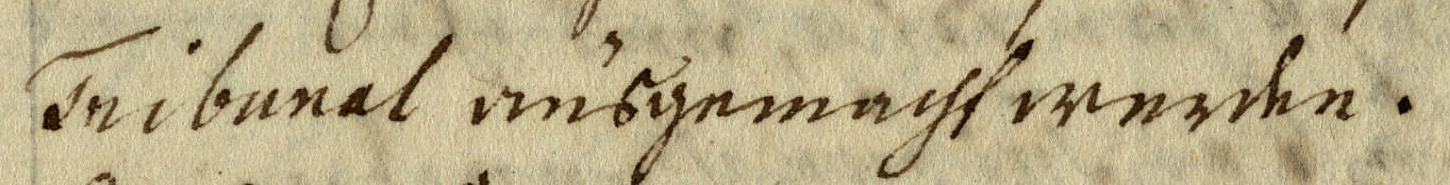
Tribunal ausgemacht werden.
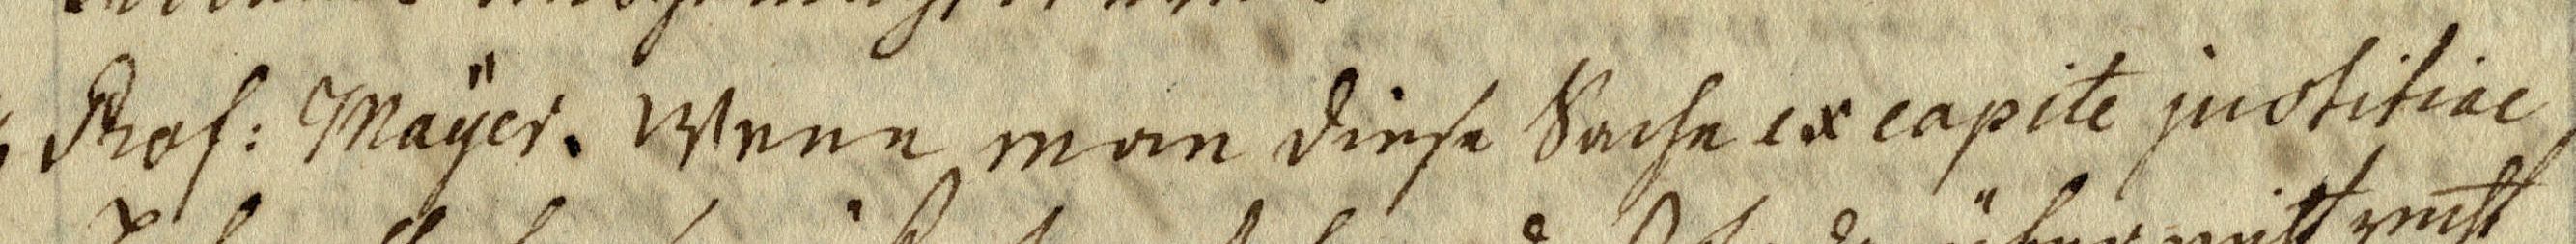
dh Prof. Maÿer. Wenn man diese Sache ex eapite justititae
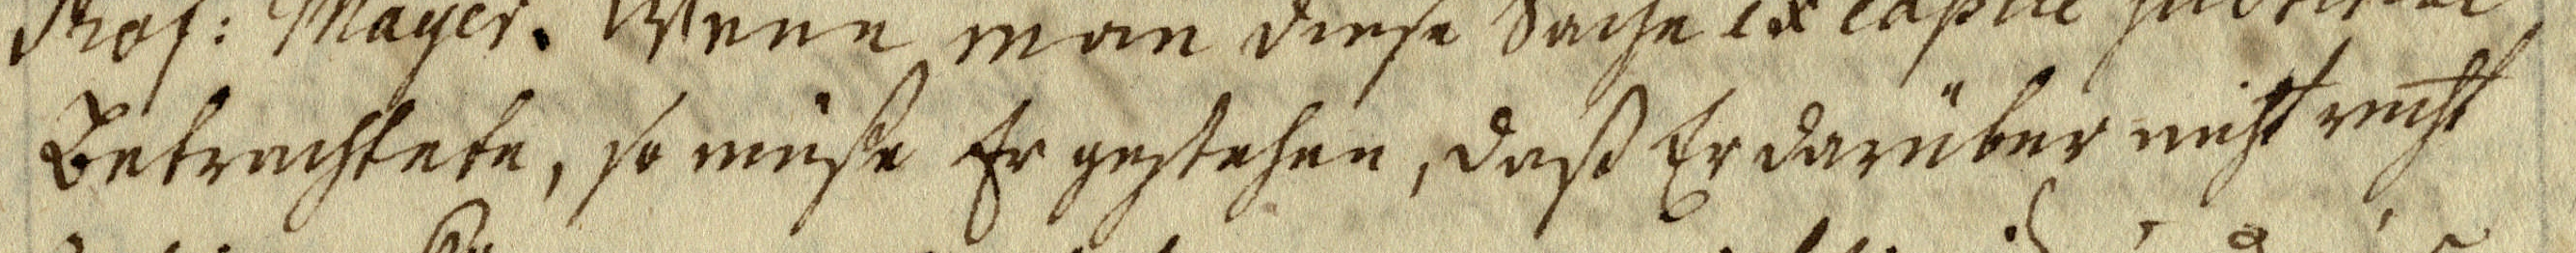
betrachtete, so müße Er gestehen,daß Er darüber nicht recht
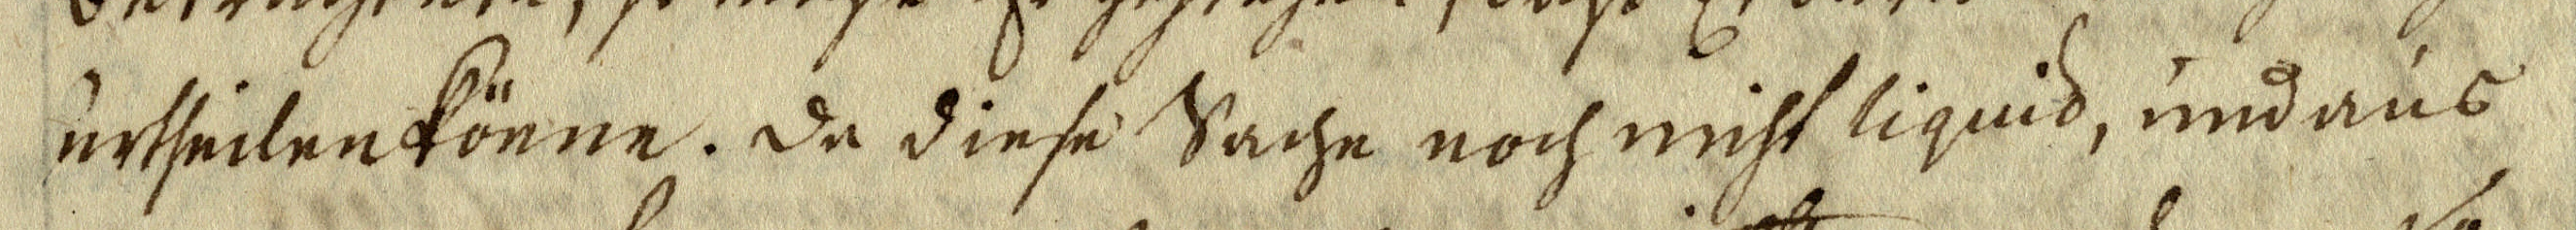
urtheilen könne. Da dieseSache noch nicht liquid, und aus
